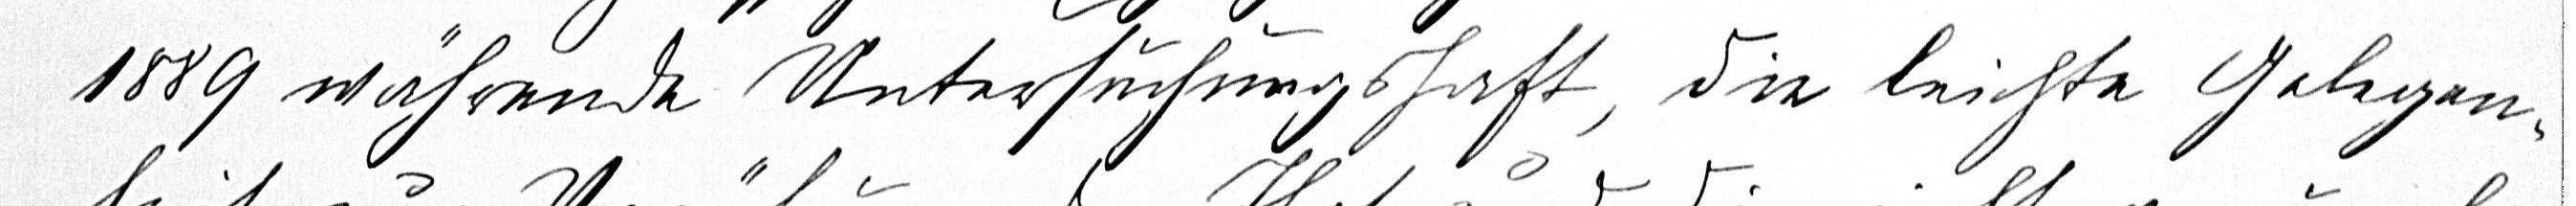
1889 währende Untersuchungshaft, die leichte Gelegen¬
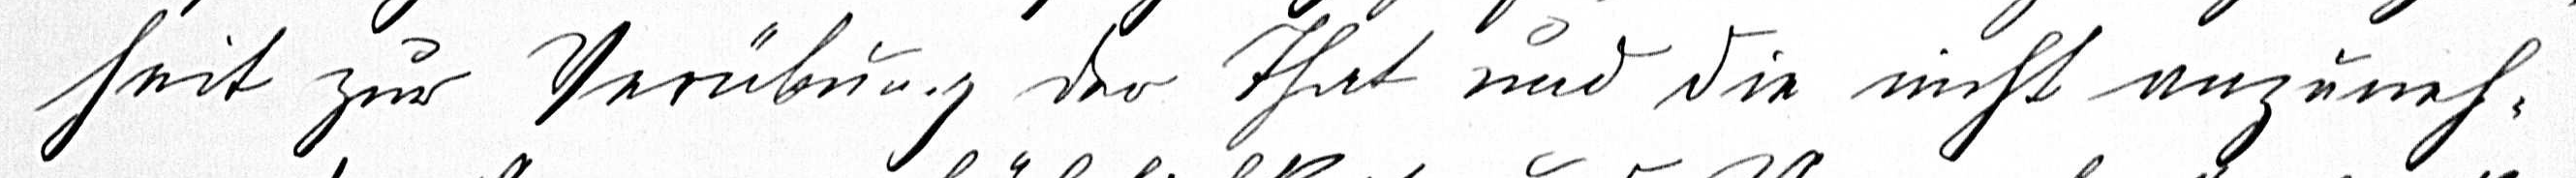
heit zur Verübung der That und die nicht anzuneh¬
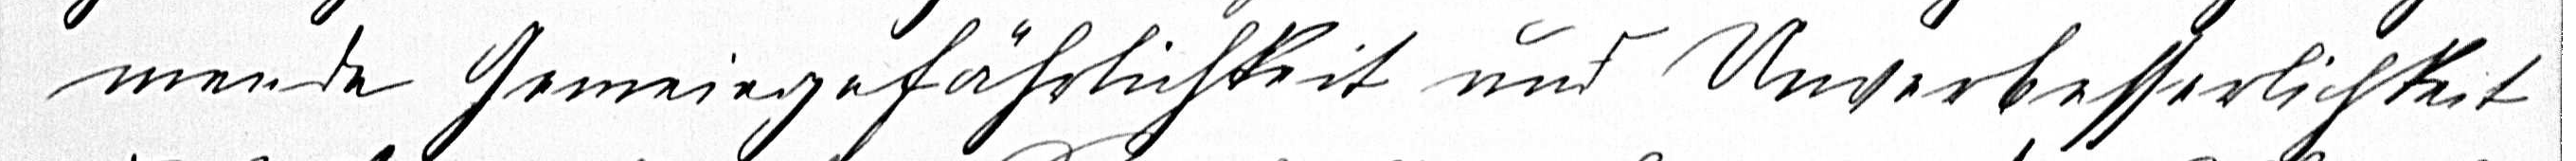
mende Gemeingefährlichkeit und Unverbesserlichkeit
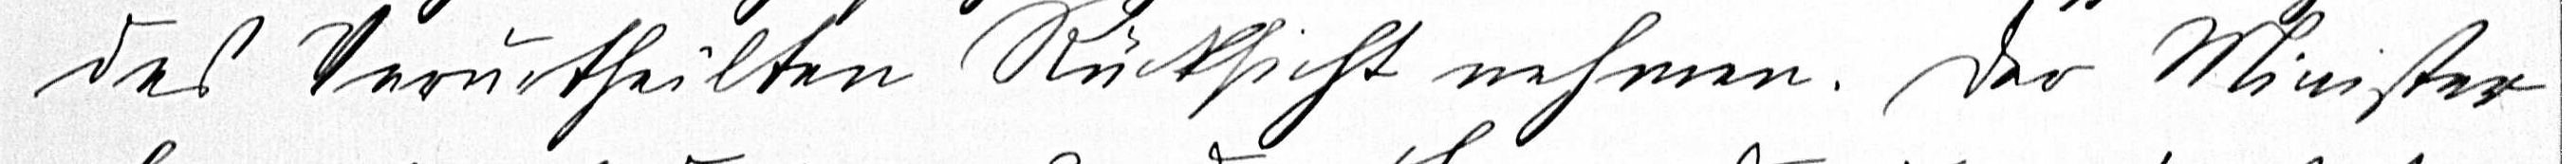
des Verurtheilten Rücksicht nehmen. Der Minister
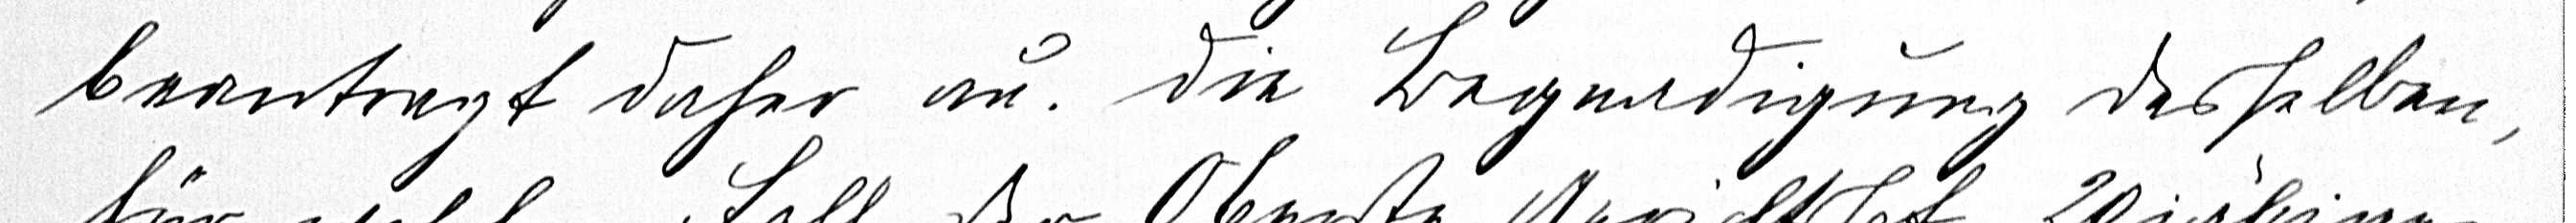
beantragt daher au. die Begnadigung desselben,
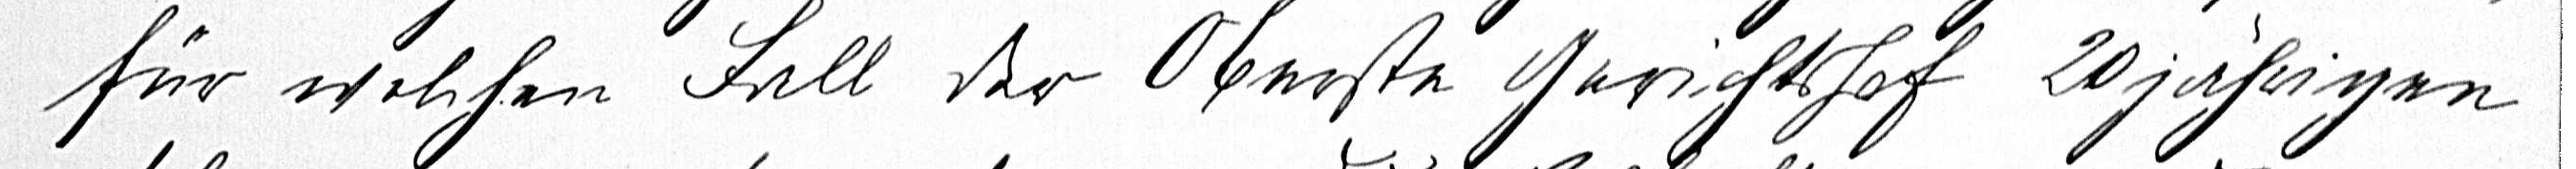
für welchen Fall der Oberste Gerichtshof 20jährigen
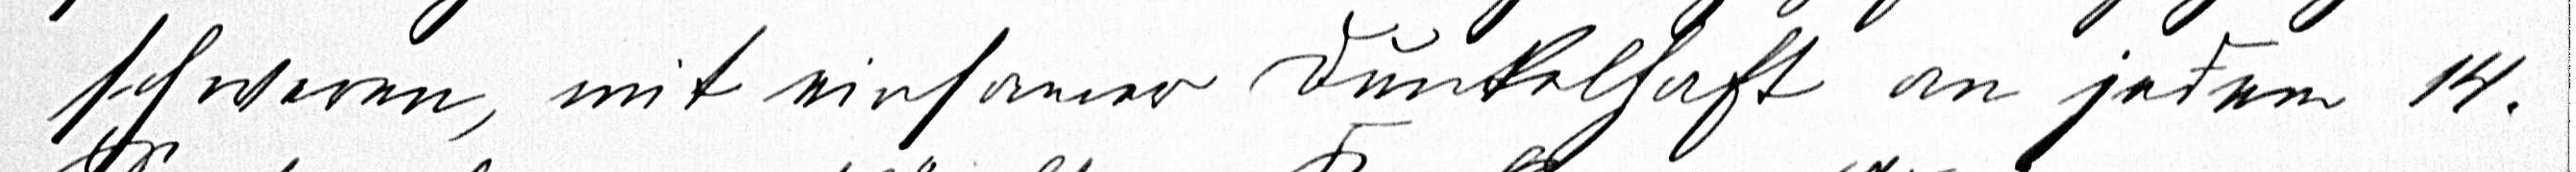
schweren, mit einsamer Dunkelhaft an jedem 14.
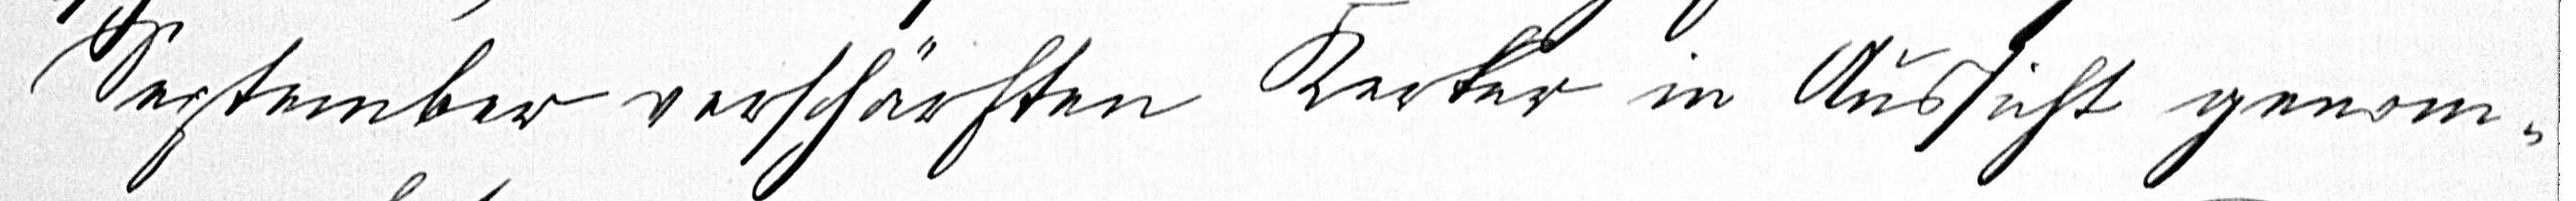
September verschärften Kerker in Aussicht genom¬
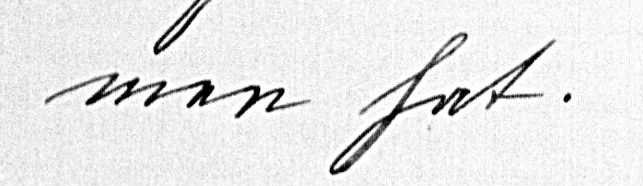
men hat.
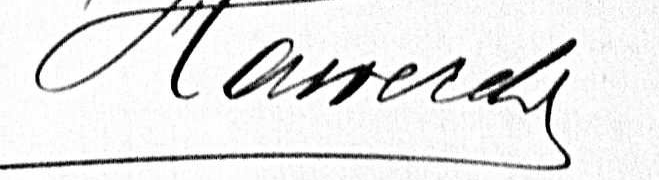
Hawerd
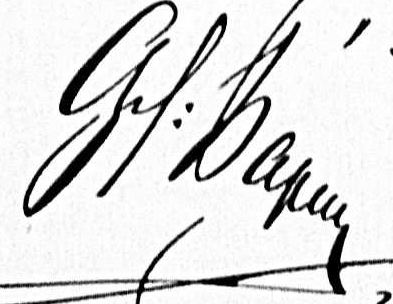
Grf Basny
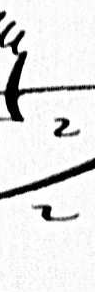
2/2
